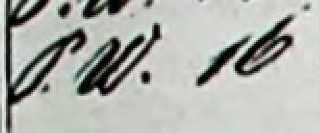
P.W. 16
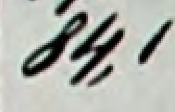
84,1
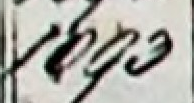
1093
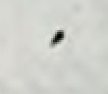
„
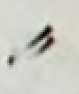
„
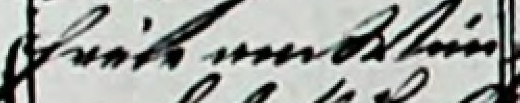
Freie am Wei
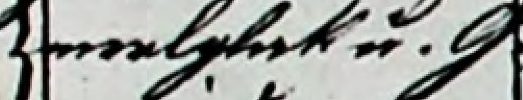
nerlplatt u. Ge„
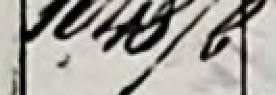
1648/b
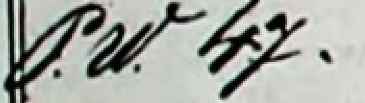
P.W. 47
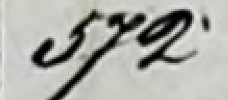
572
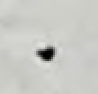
„
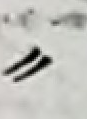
„
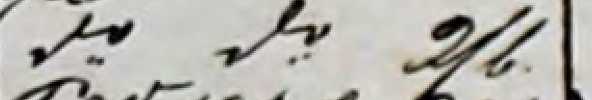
Do Do 2/b
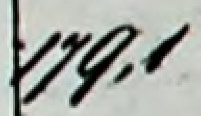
179,1
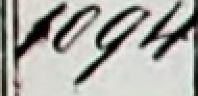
1094
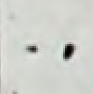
„
